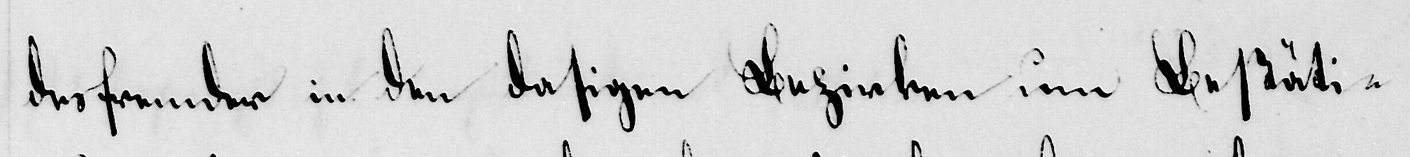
desfremder in den dasigen Bezirken um Bestäti¬
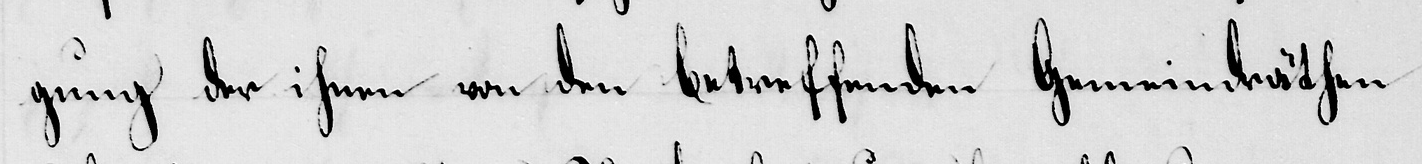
gung der ihnen von den betreffenden Gemeindräthen
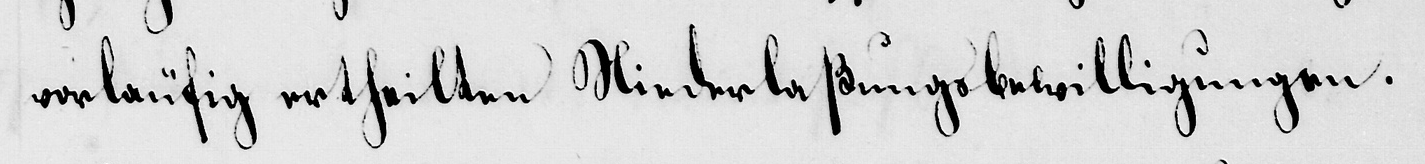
vorläufig ertheilten Niederlaßungsbewilligungen.
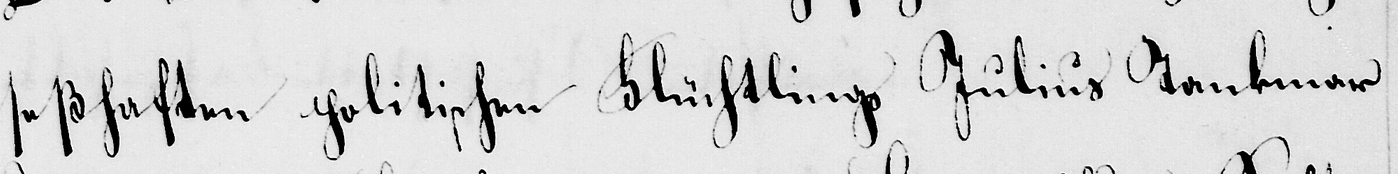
seßhaften politischen Flüchtlings Julius Tankmar
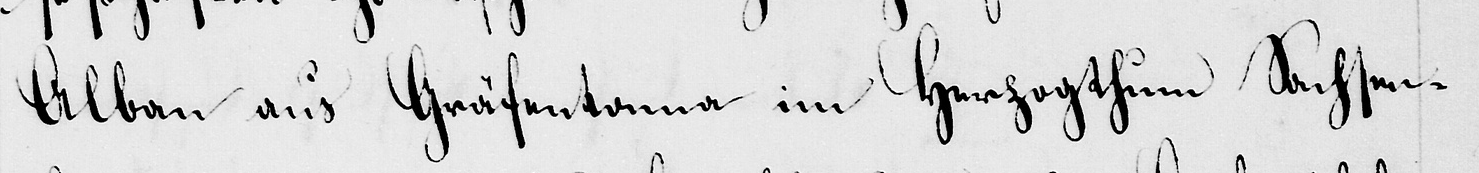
Alban aus Gräfentonna im Herzogthum Sachse¬
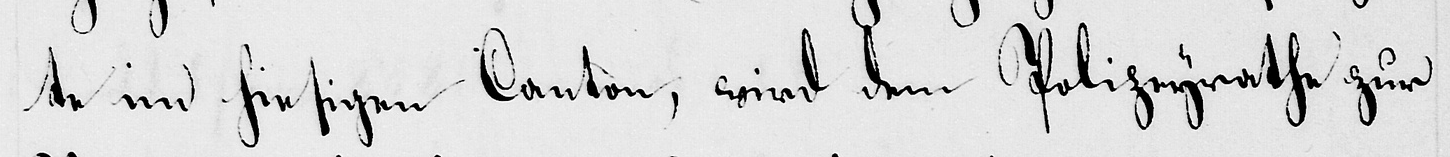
te im hiesigen Canton, wird dem Polizeyrahte zur
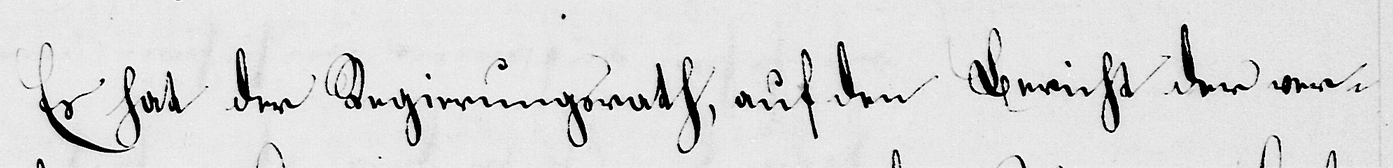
Es hat der Regierungsrath, auf den Bericht der ver¬
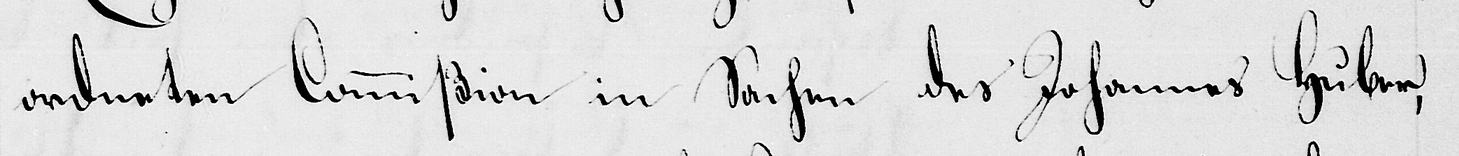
ordneten Commißion in Sachen des Johannes Huber,
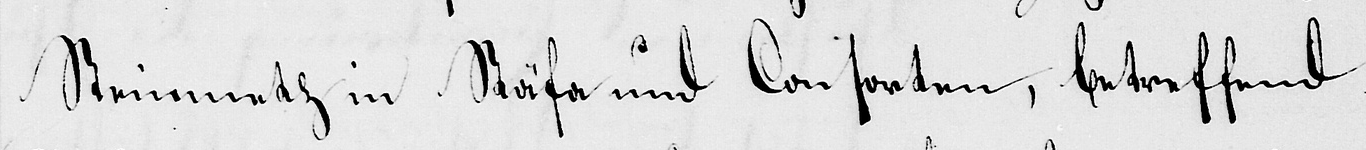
Steinmetz in Stäfa und Consorten, betreffend
